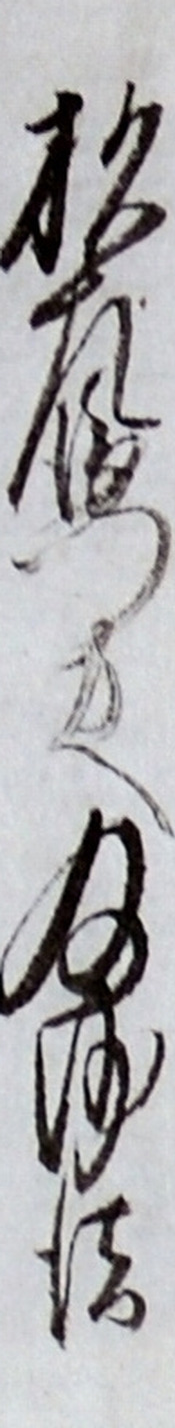杉左衛門方へ
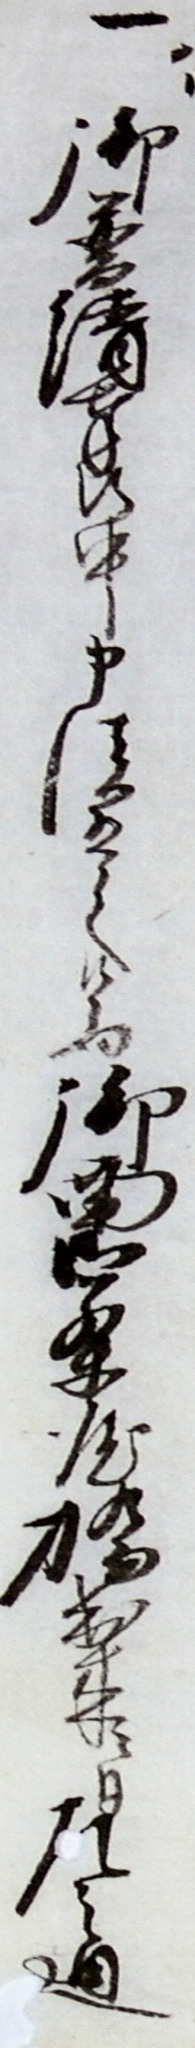一御普請奉行中申談有之候而御南御茶屋橋出来ニ付左之通
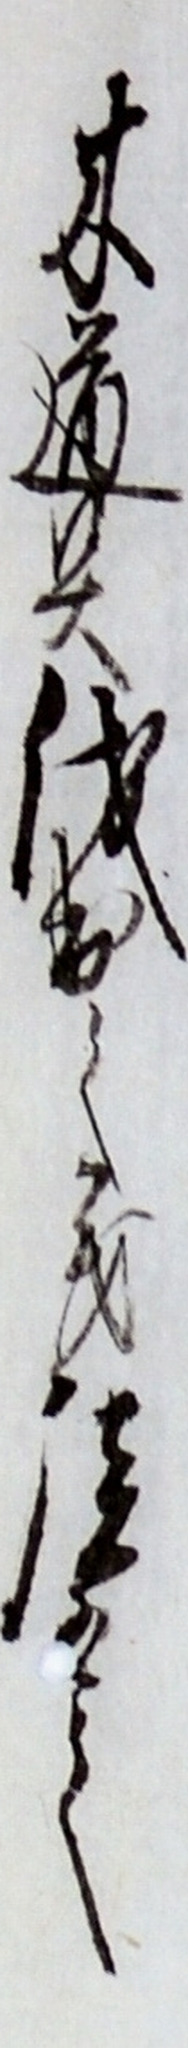木道具伐出之義談有之

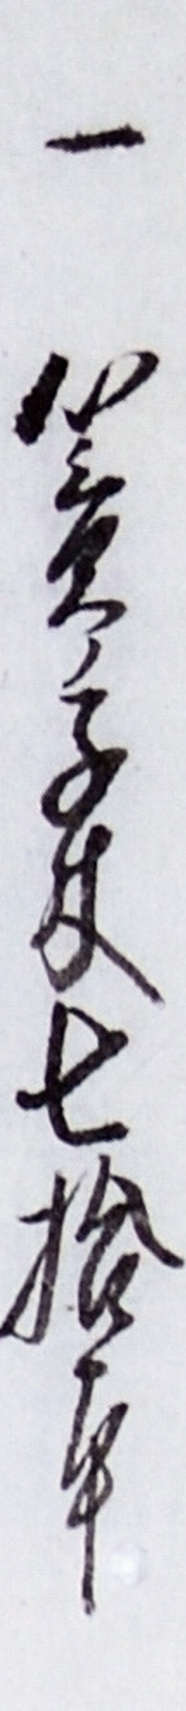一簀ノ子木七拾本
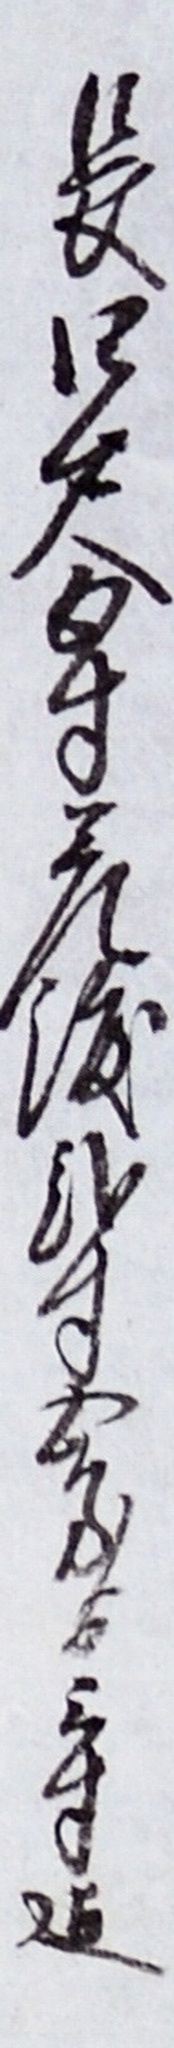長四尺五寸差渡弐寸五分より三寸迄
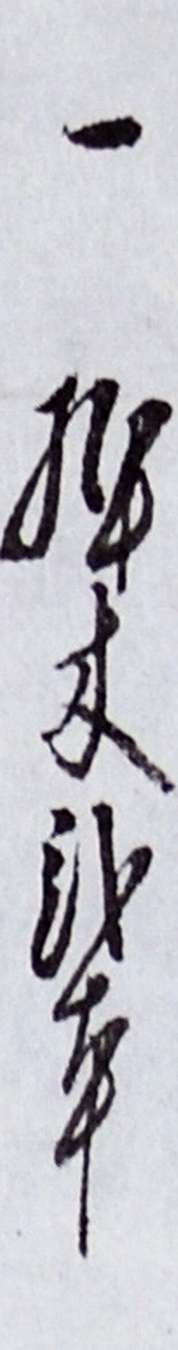一枠木弐本
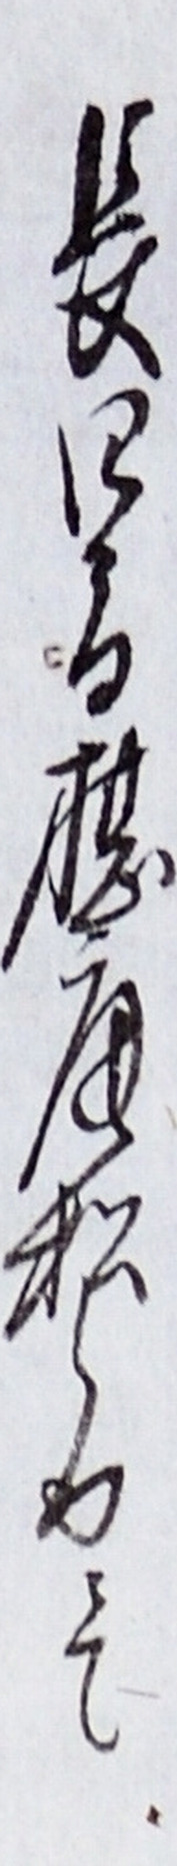長四間椹唐松之内ニて
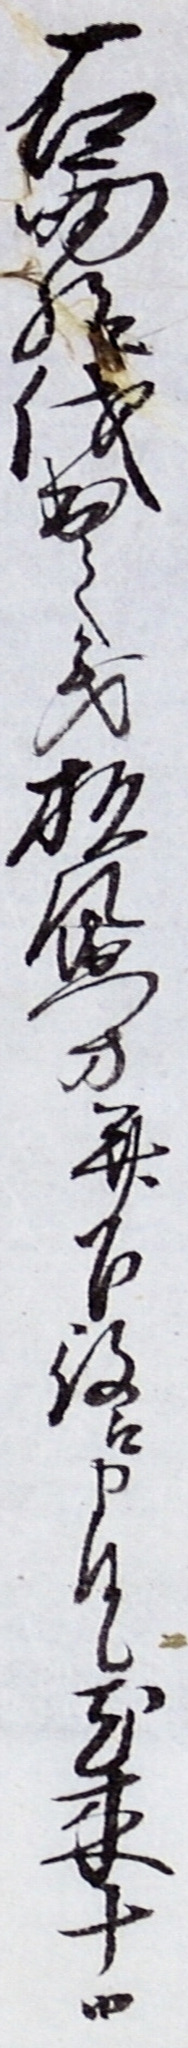右両様伐出之義杉左衛門方并下役江申付候尤来十日
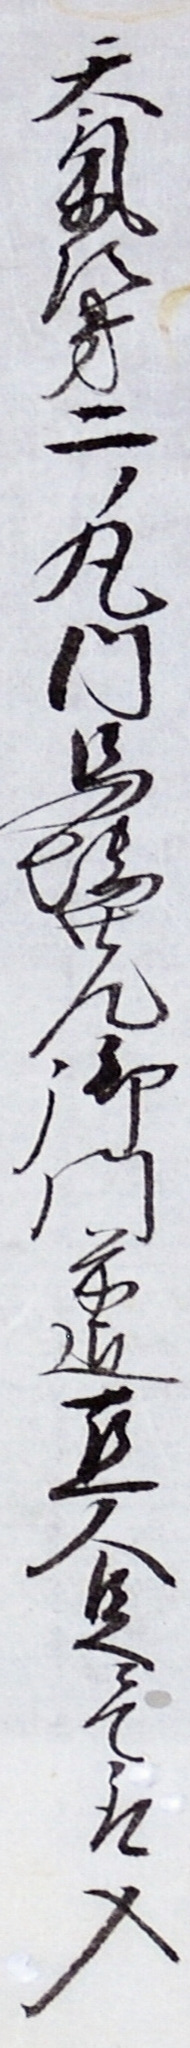天気次第二ノ丸門馬場先御門前迄直人足ニて取入
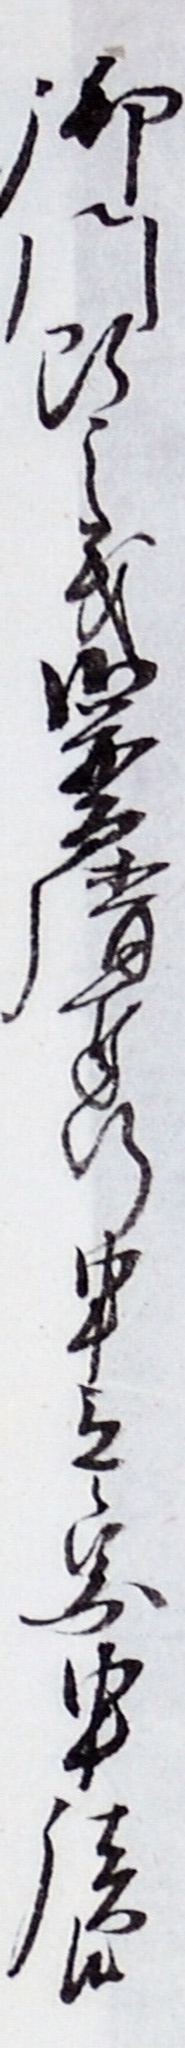御門改之義御普請奉行申立之図申談候
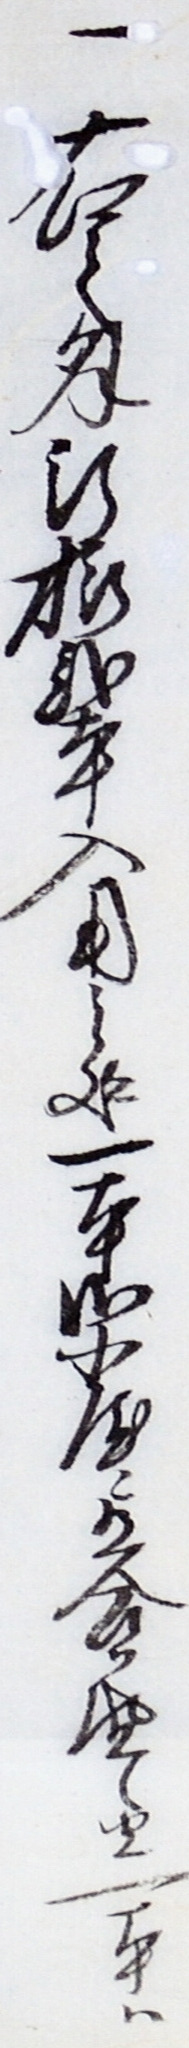一右之外行桁弐本入用之処一本御小屋ニ有合御座候由一本ハ
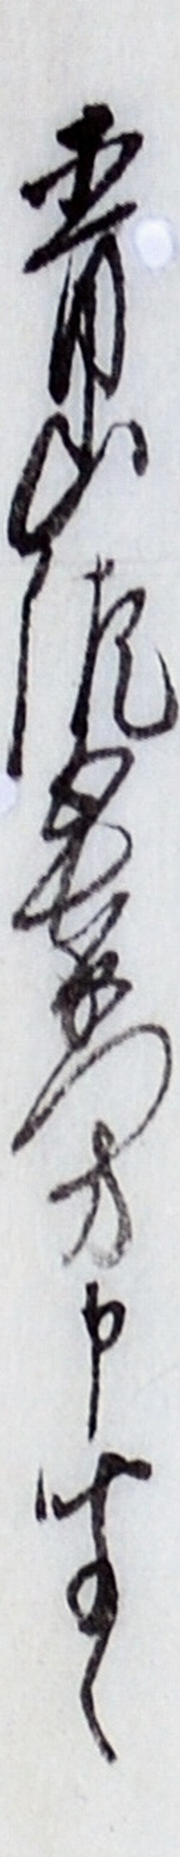青山佐五右衛門方申聞候
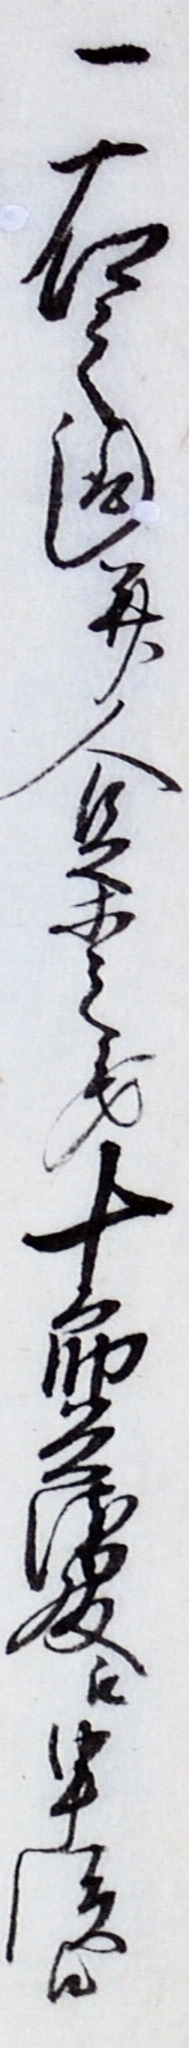一右之趣并人足等之義十郎兵衛殿江申談候
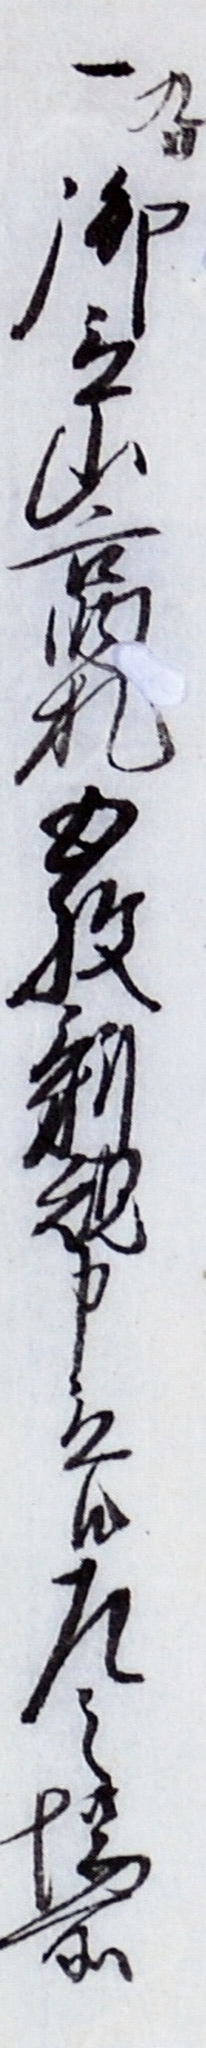一御立山高札五枚新規申立候左之場所
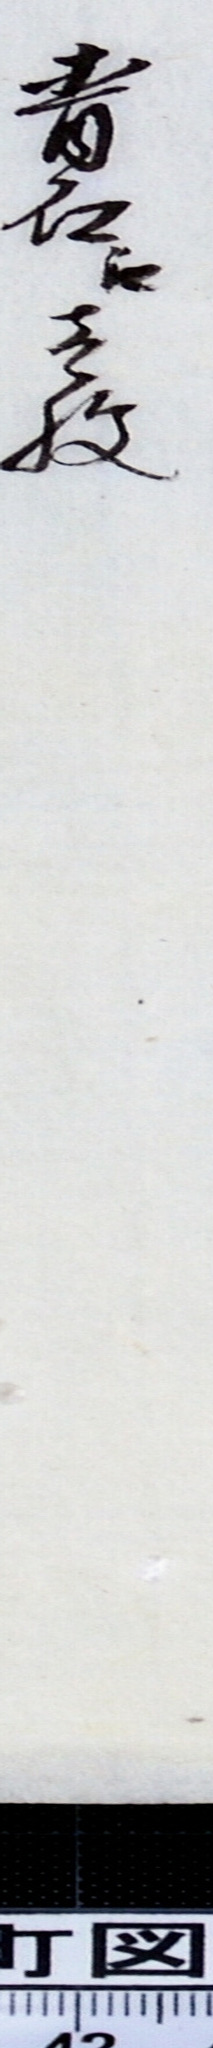青石江壱枚
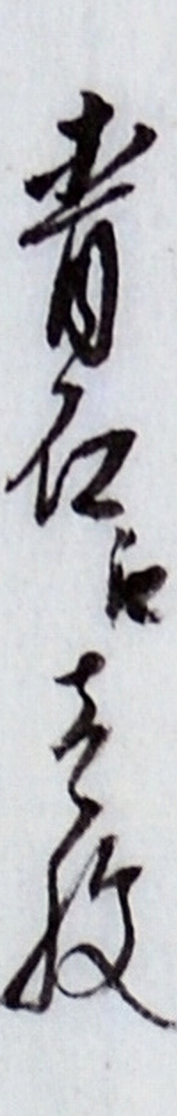青石江壱枚
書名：御山奉行御用控
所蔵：伊那市立高遠町図書館・合同会社AMANE
